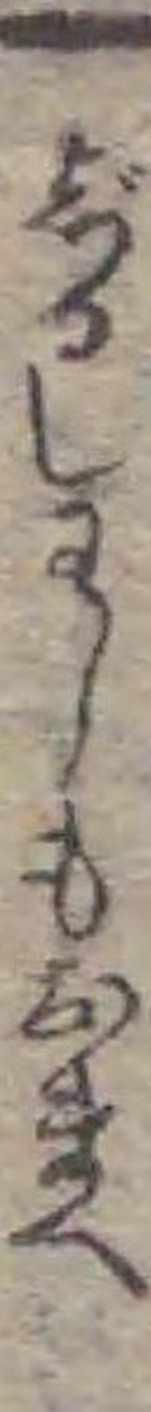じるしわしもおまへ
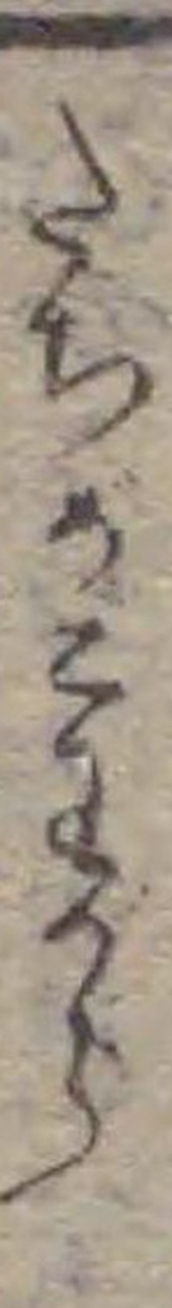たちがこわがら
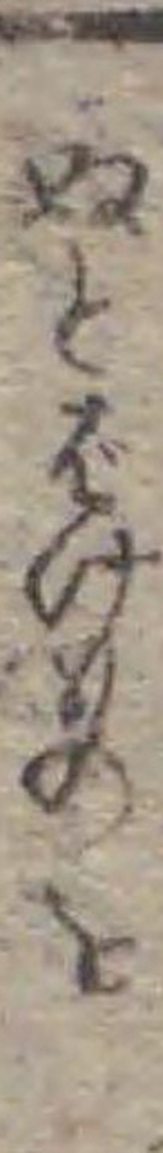ぬとばけものを
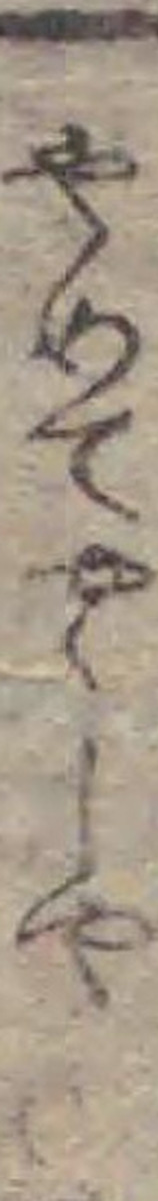やめてやくしや
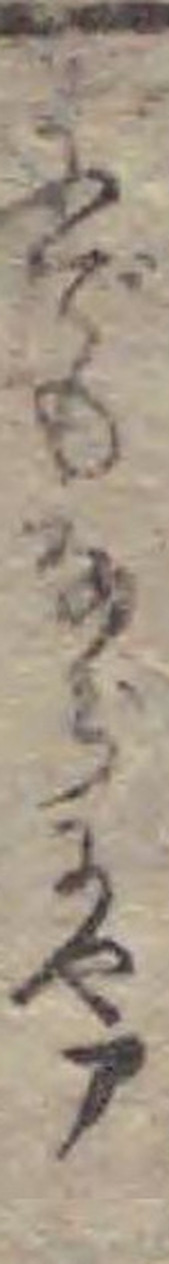にでもならにやァ
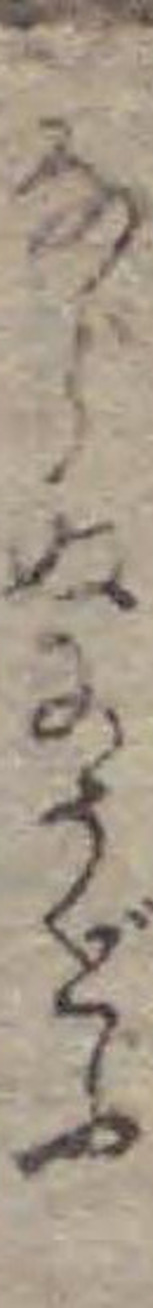ならぬにうどふ
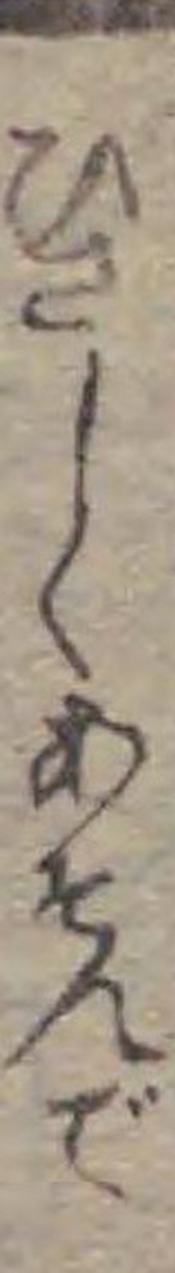ひさしくあそんで
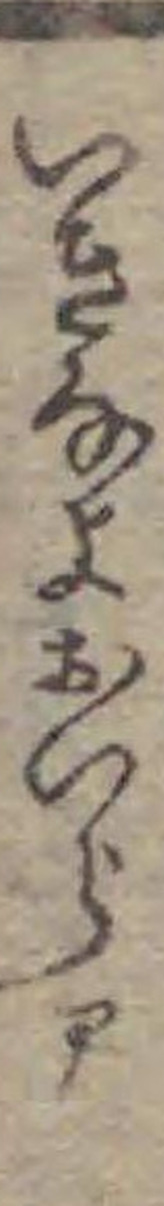いきなよおいらァ
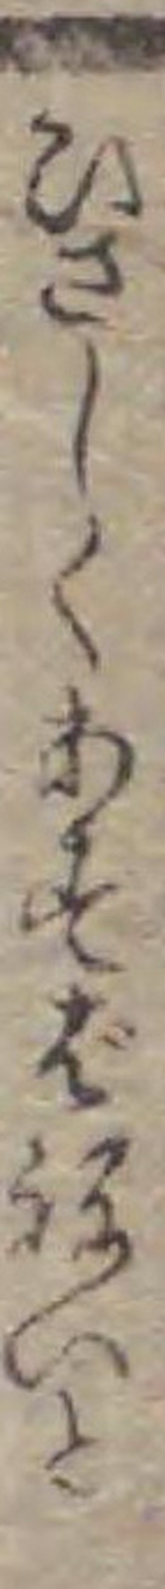ひさしくあそばねいと
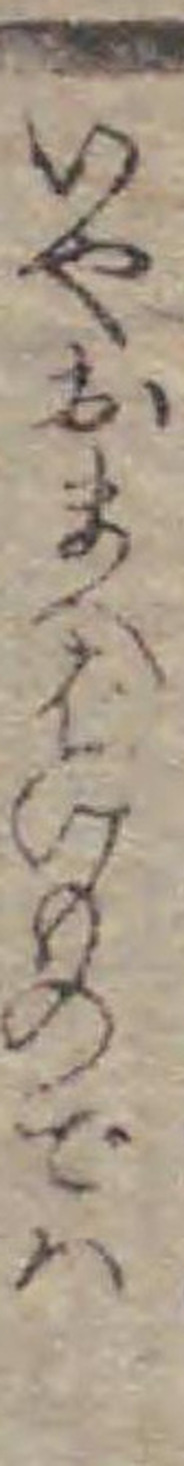いやおまへばけものでは
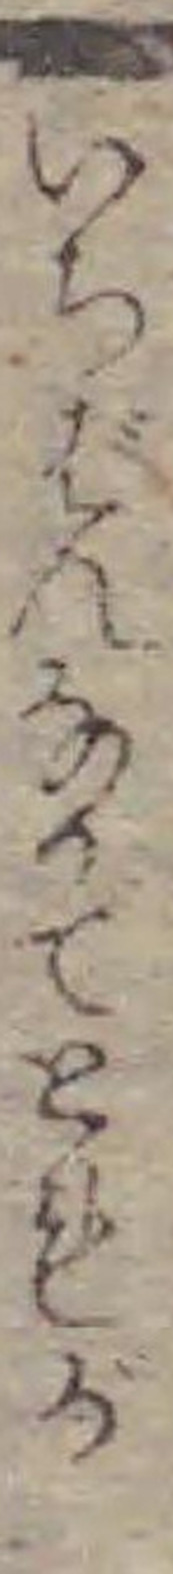いちばんなかてとれが
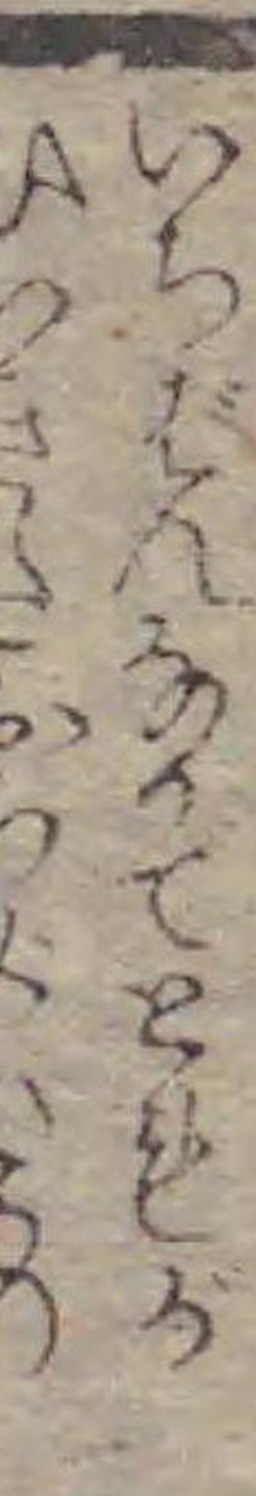ひいきたおいらはこの
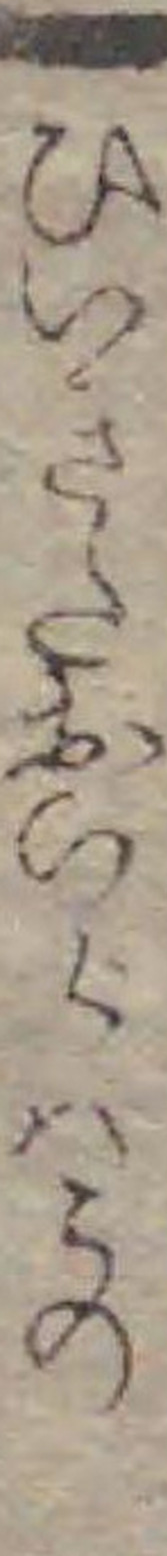ひいきたおいらはこの

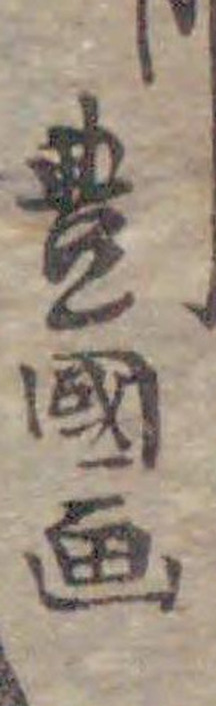豊国画
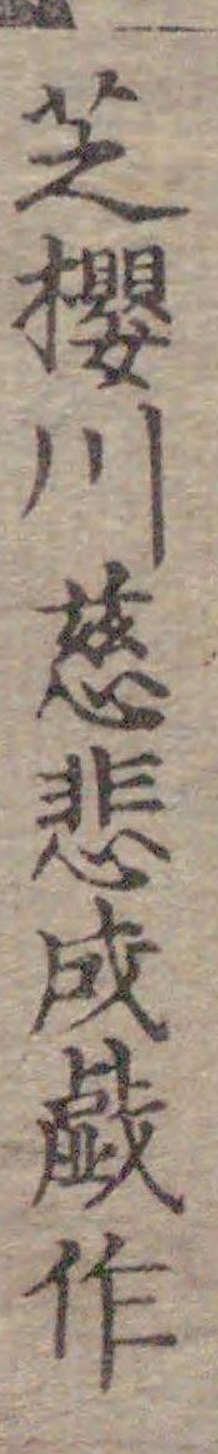桜川慈悲成戯作
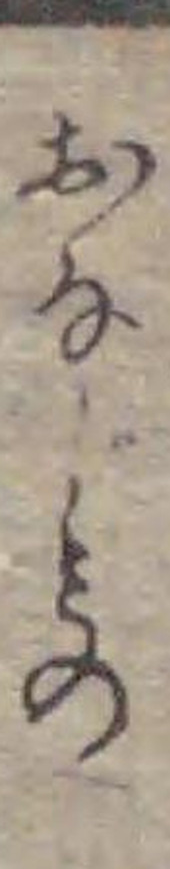おなしみの
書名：変化物春遊 : 2巻
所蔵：国立国会図書館 National Diet Library, JAPAN
